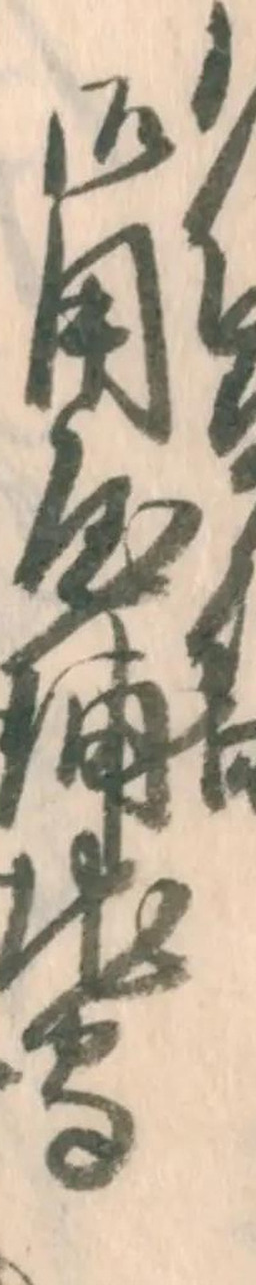御用屋鋪地守
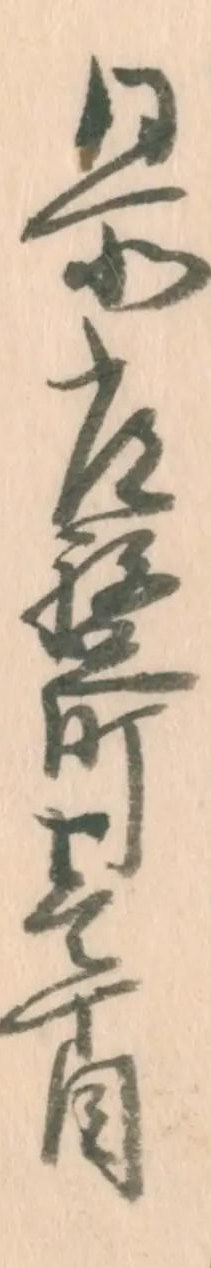同所常盤町壱丁目
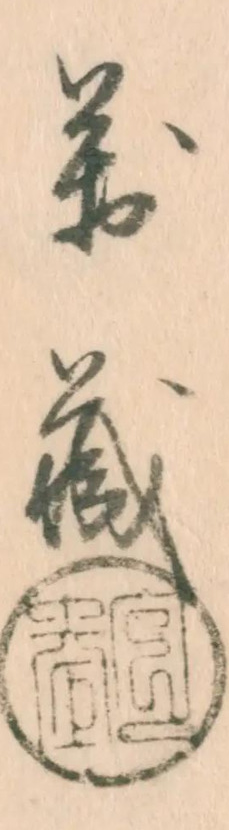万蔵(印)
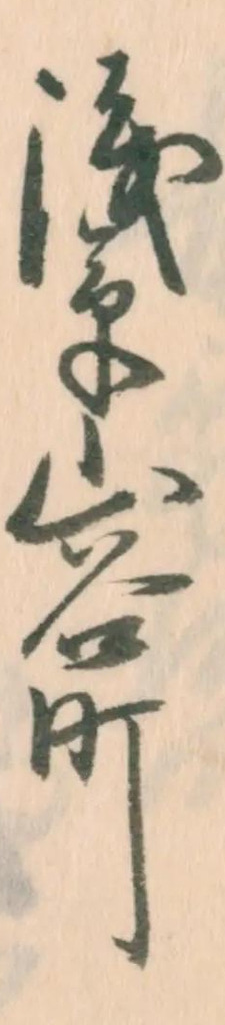浅草山谷町
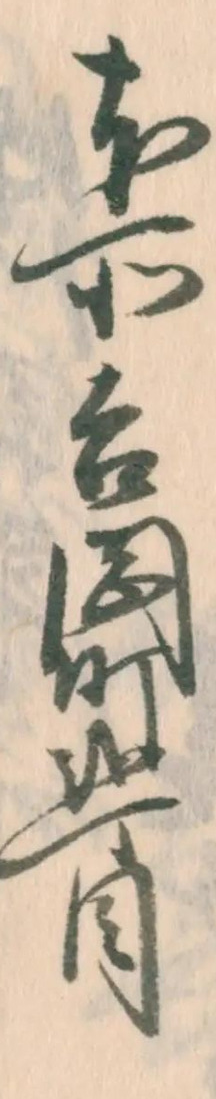本所吉岡町弐丁目
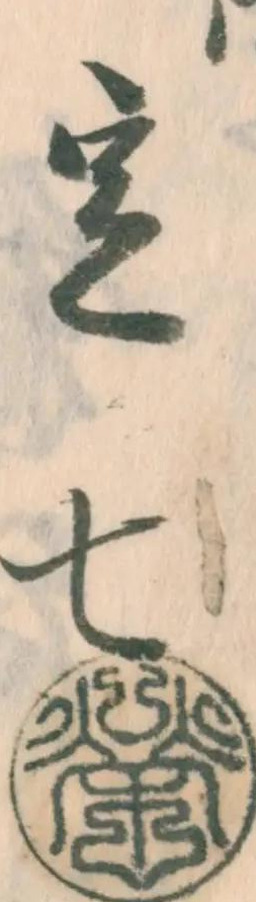定七(印)
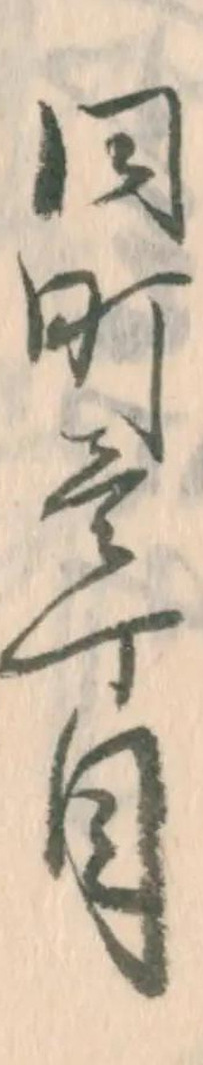同町壱丁目

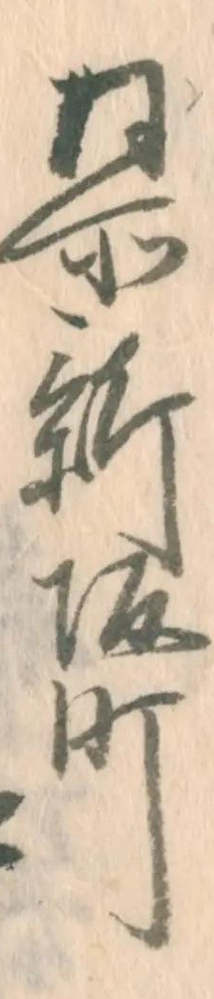同所新坂町
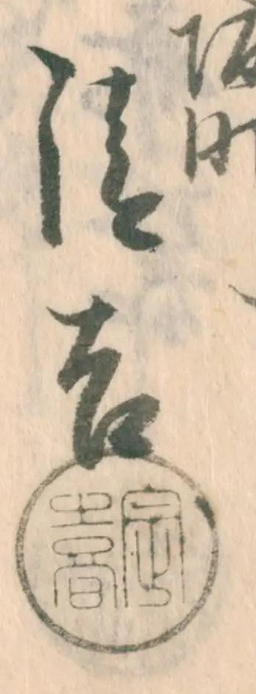清吉(印)
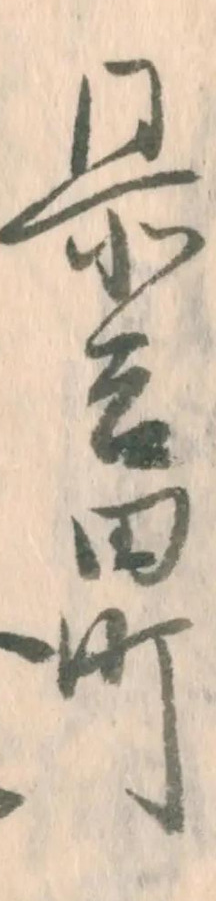同所吉田町
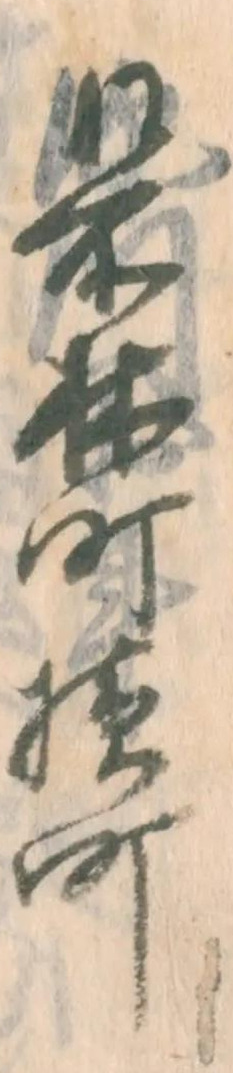同所林町横町
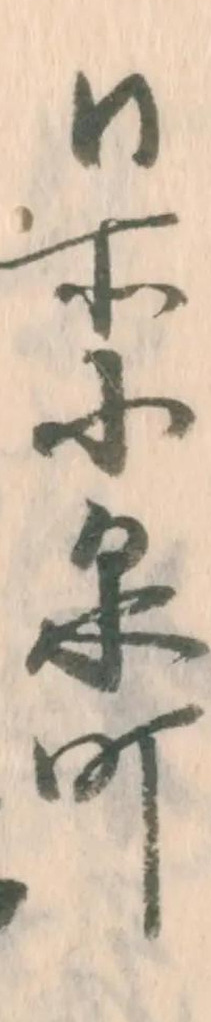同所小泉町
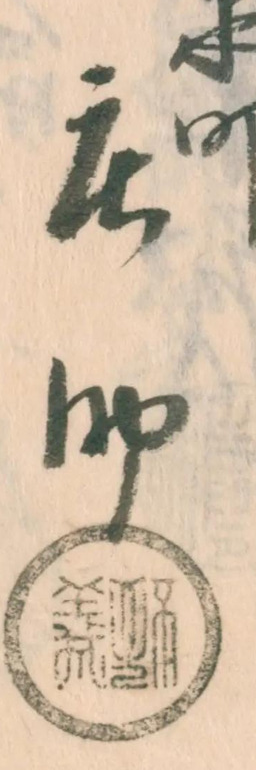庄助(印)
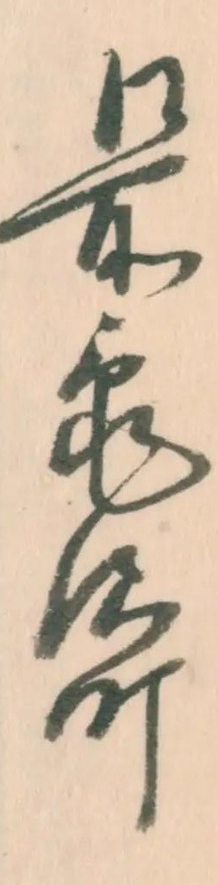同所亀沢町
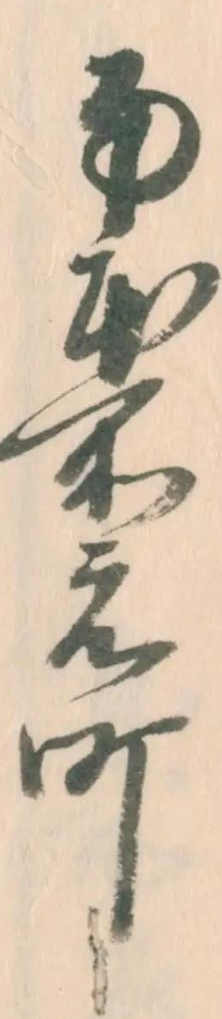南本所元町
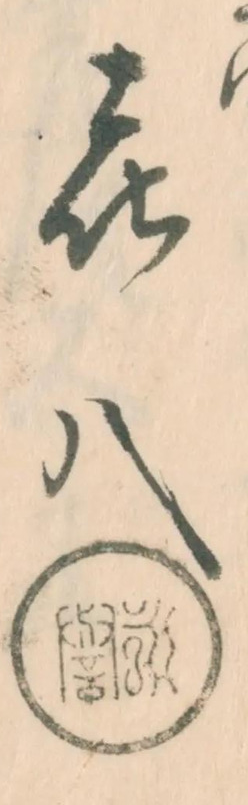喜八(印)
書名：地震災書留 2巻. [1] 内表紙に「地震災書留　安政二卯年　但本所深川御用屋敷地代免除調」とあり
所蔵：国立国会図書館 National Diet Library, JAPAN
